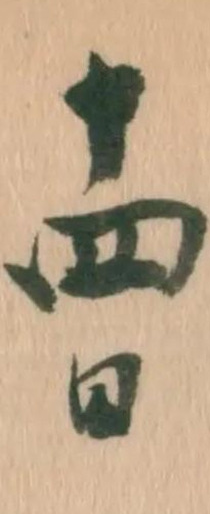十三日
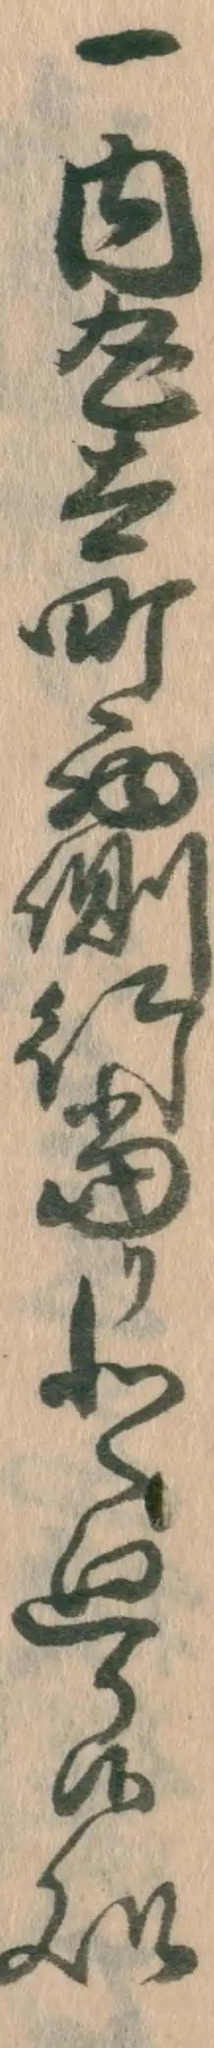一内丸太町西側行当り北へ廻り候処
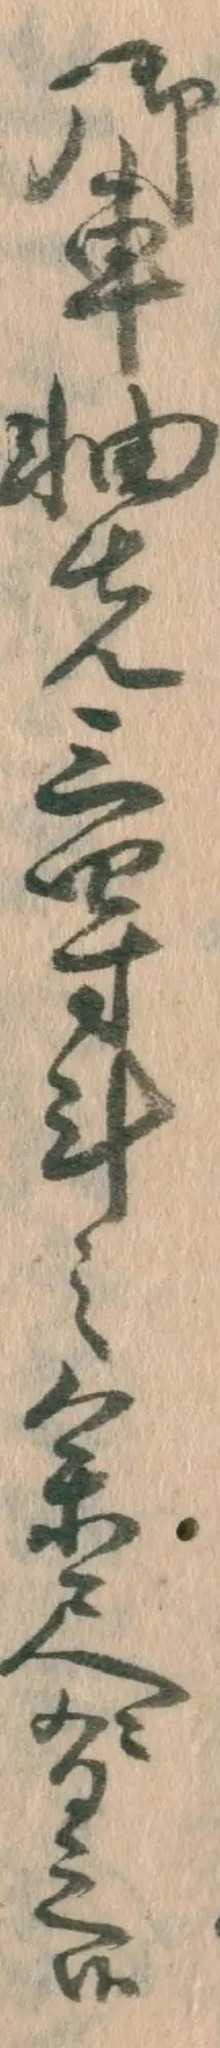御車軸先三四寸斗之余尺ニ有之候
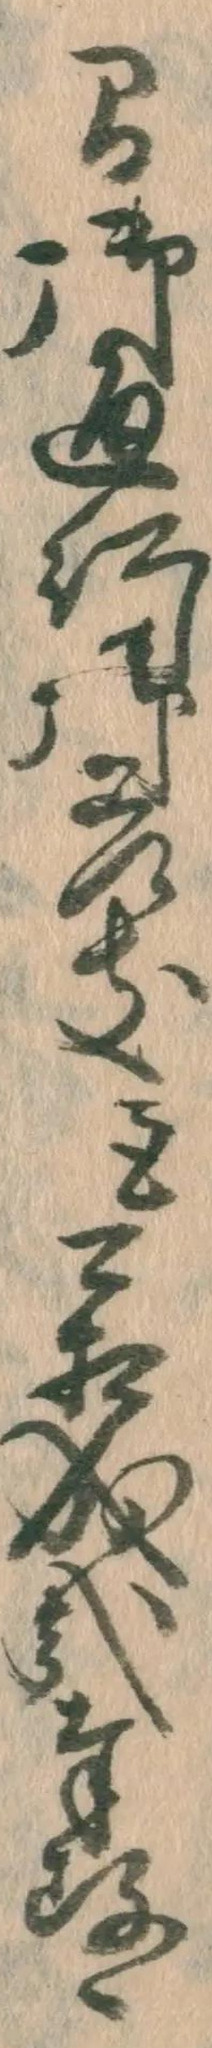間御通行御差支ニも可相成哉奉存候
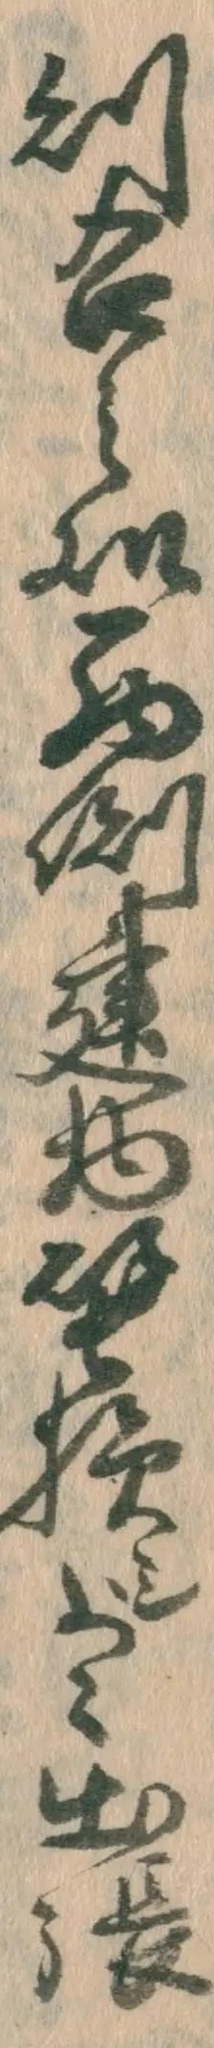則右之処西側建物壁損シ少々出張
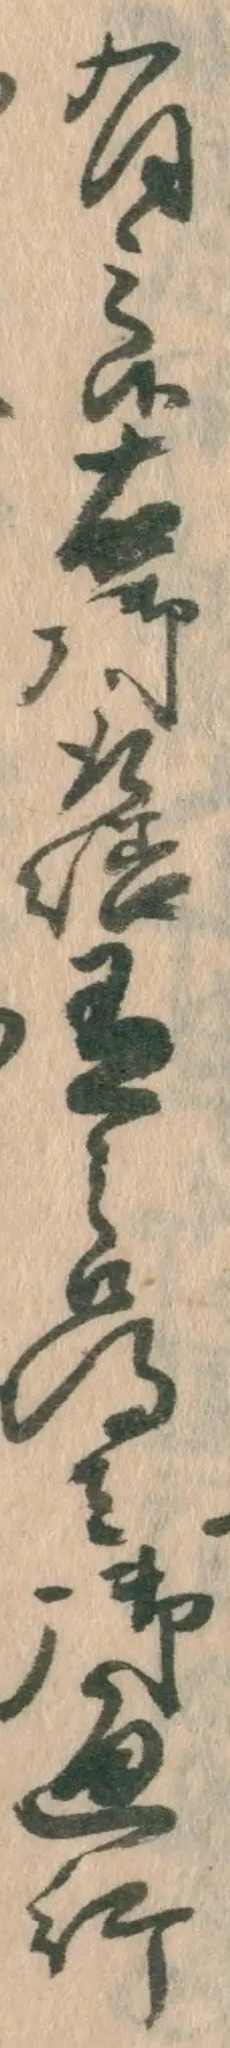有之候右御取繕有之候得者御通行
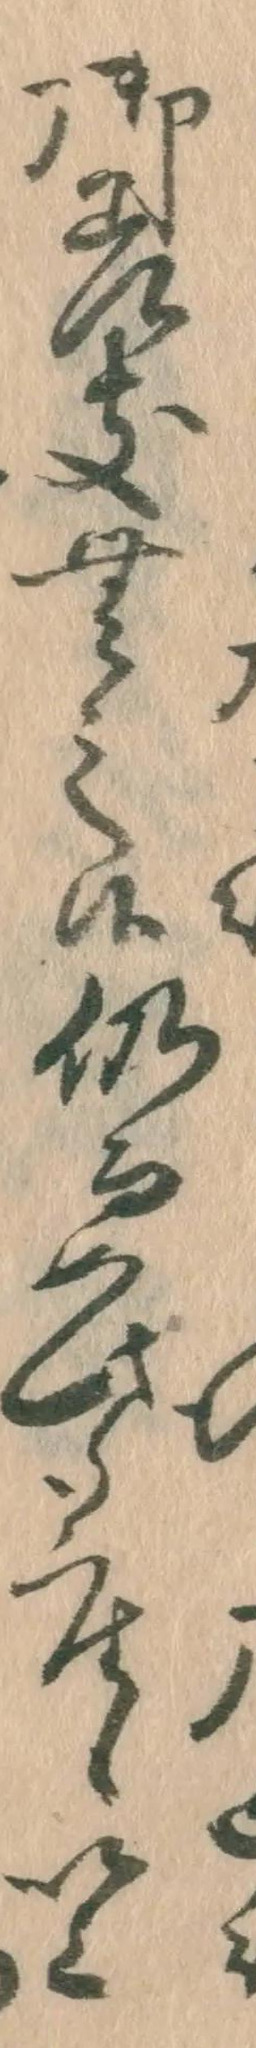御差支無之候仍而如此御座候以上
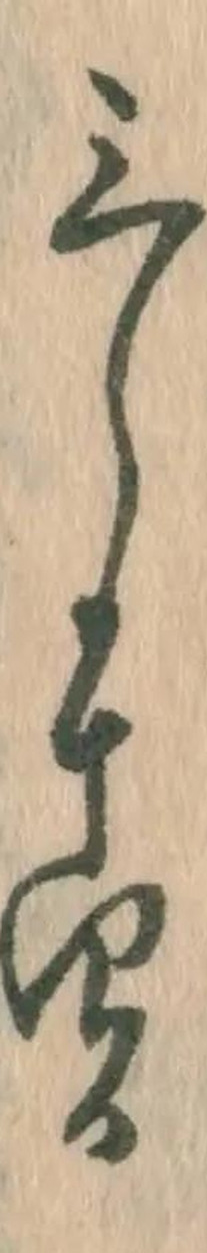三月十四日
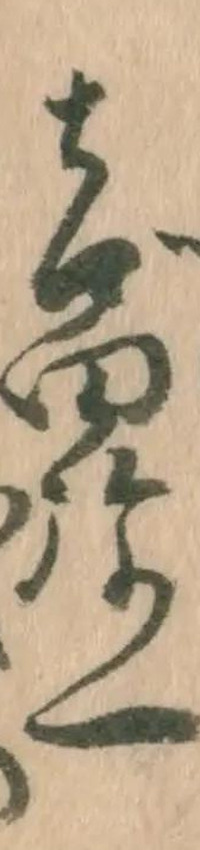吉田弥一
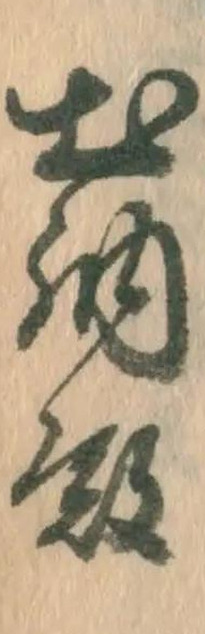出納殿
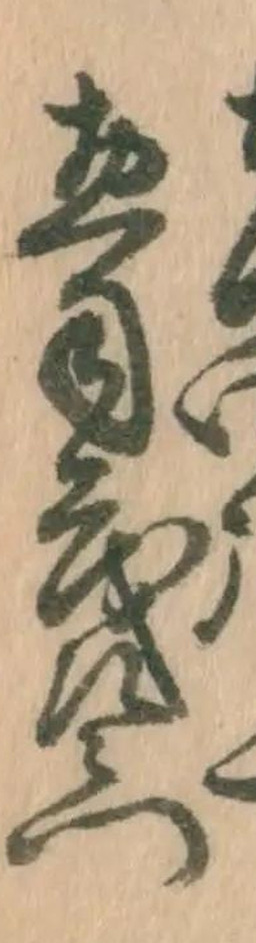惣司茂左衛門

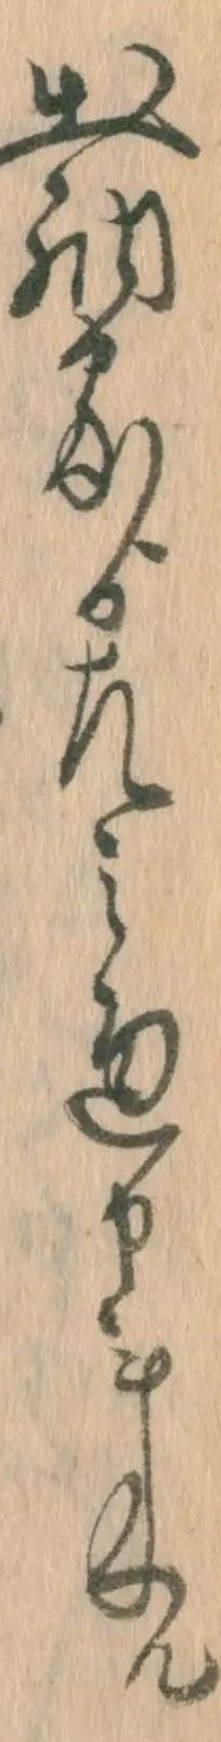出納家ゟ左之通申来ル
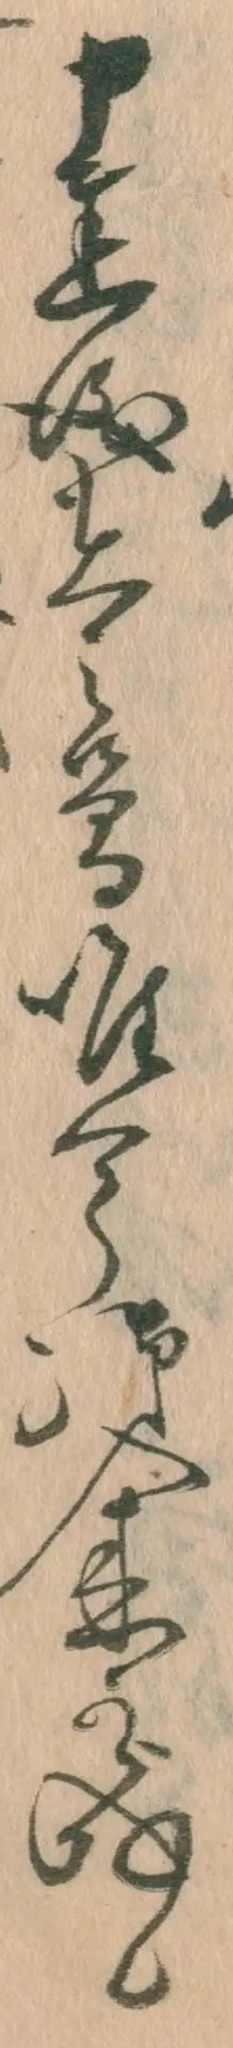申達儀在之候間唯今御入来可被成候
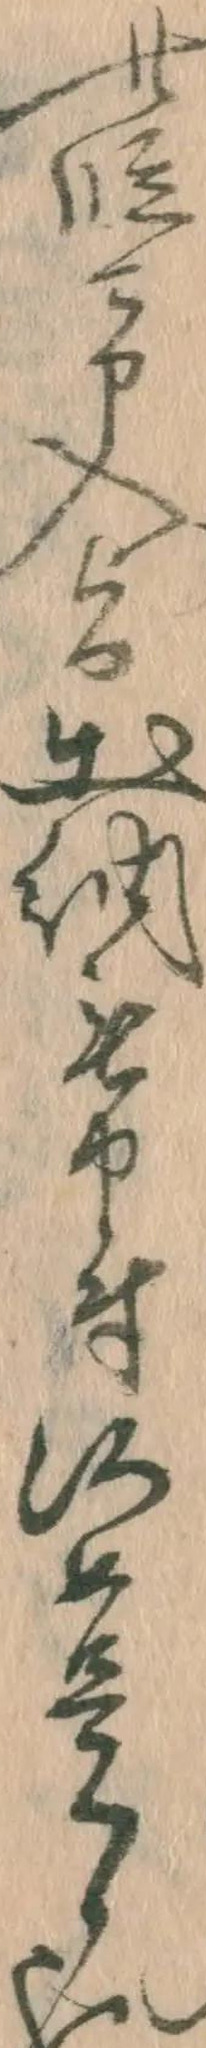此段可申入旨出納被申付仍如是候也
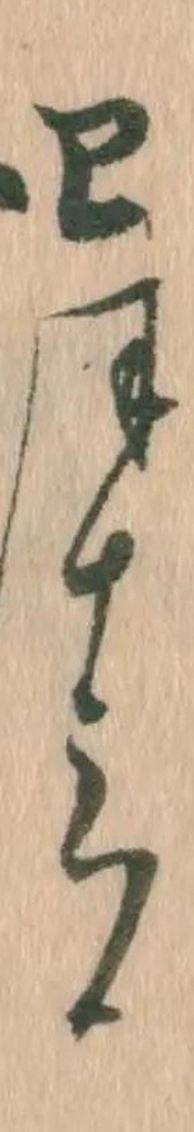四月十三日
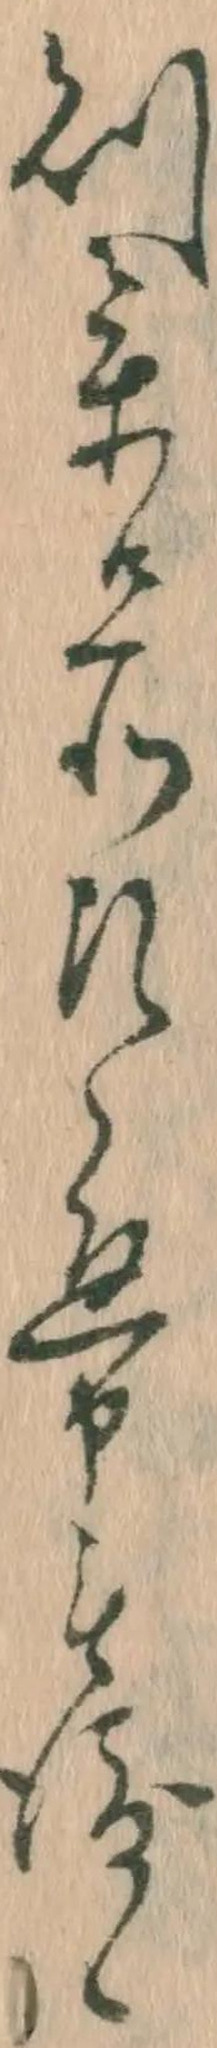則参候所左之通申被渡候
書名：賀茂社記録. 第61冊
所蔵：国立国会図書館 National Diet Library, JAPAN
